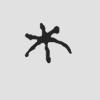木
